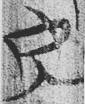𡚦（焉）
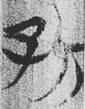孤
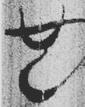也
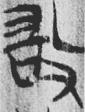敢
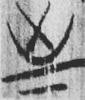至（致）
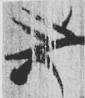先
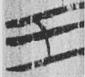王
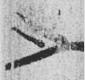之
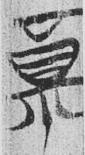福
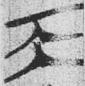天
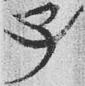子
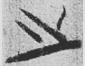之
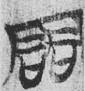霝（靈）
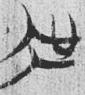吳
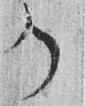人
